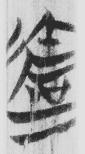逹
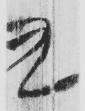九
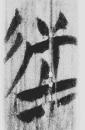迀
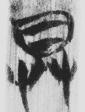具
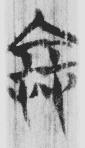𡨄
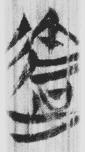逹
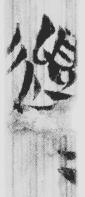道=
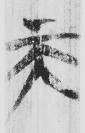天
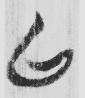㠯（以）
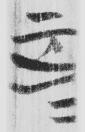正=
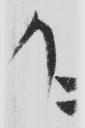人=
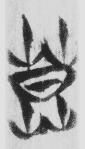莫
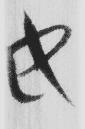女
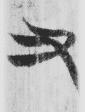又
